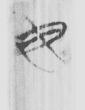母
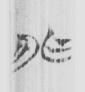非
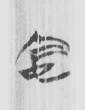{宀𠁩}
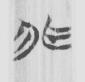非
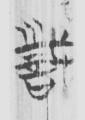{川言戈}
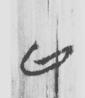㠯（以）
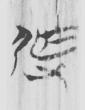{尸拃}
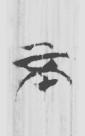不
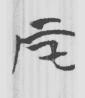厇
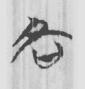各
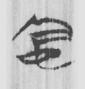{宀𠁩}
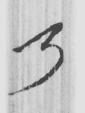乃
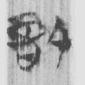信
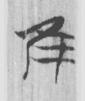隹
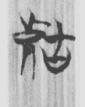{歺古}
